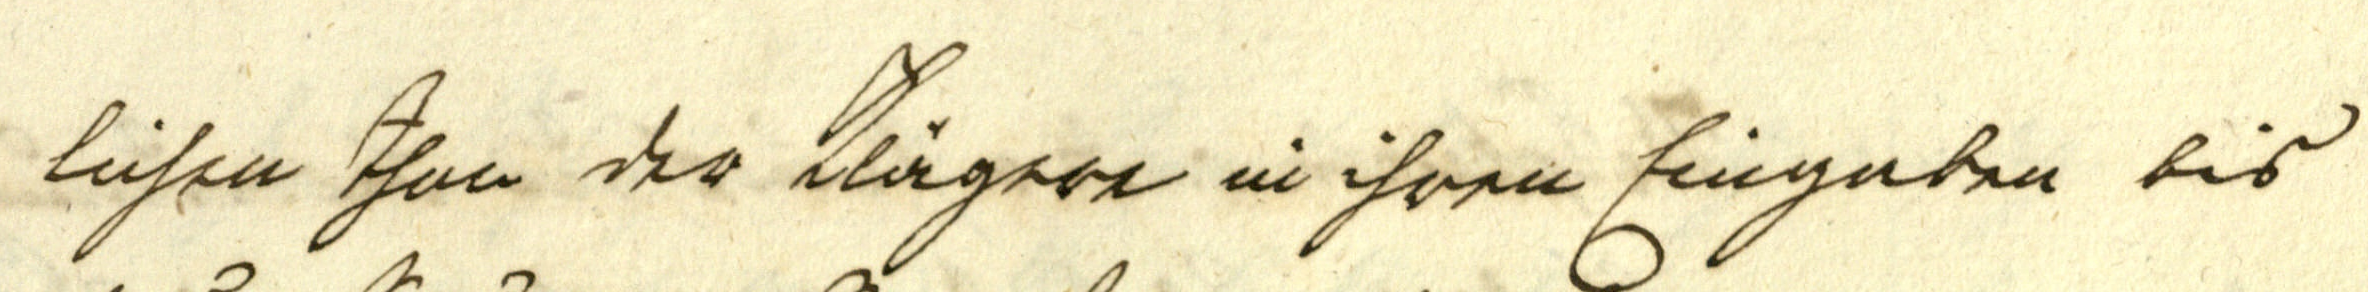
lichen Thon der Klägere in ihren Eingaben bis
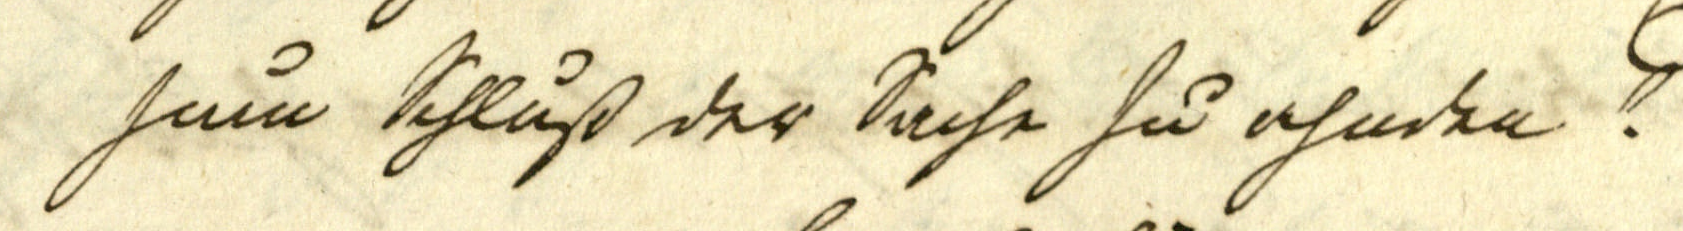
zum Schluß der Sache zu ahnden?
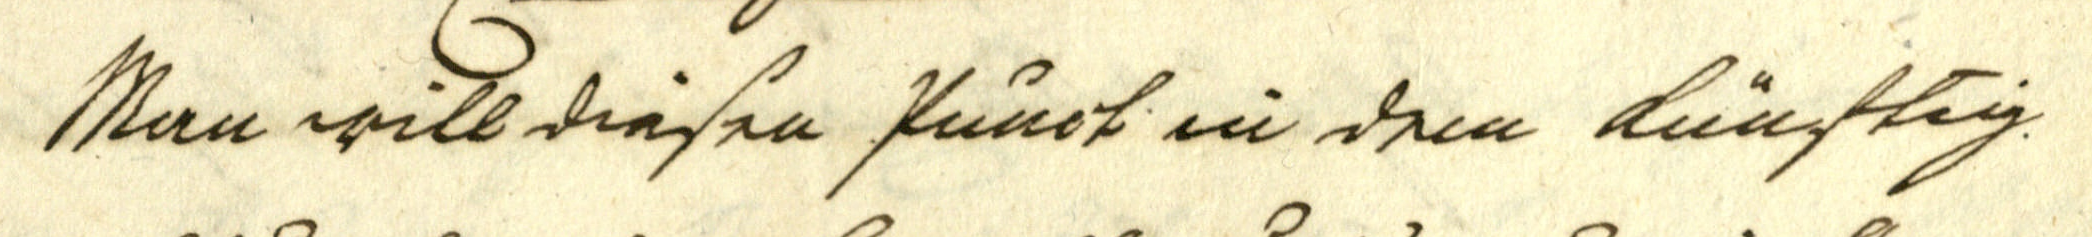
Man will diesen Punct in dem künftig
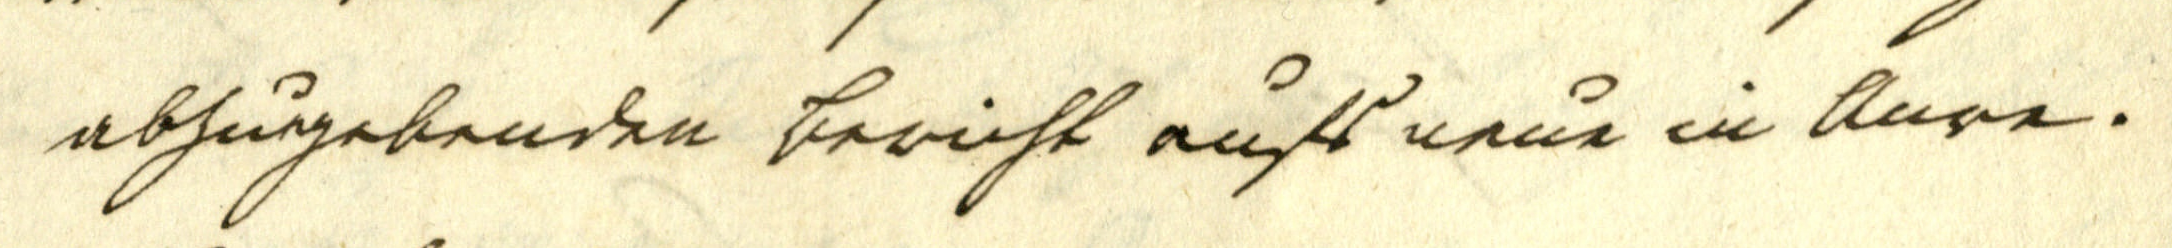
abzugebenden Bericht aufs neue in Anre¬
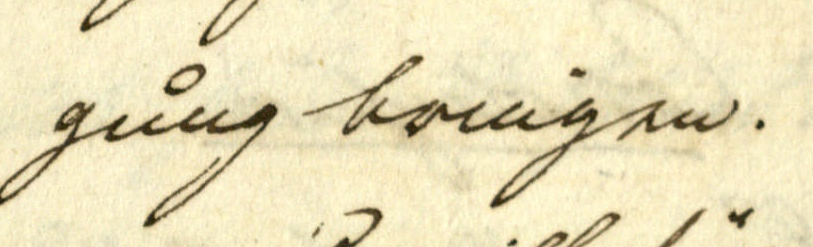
gung bringen.
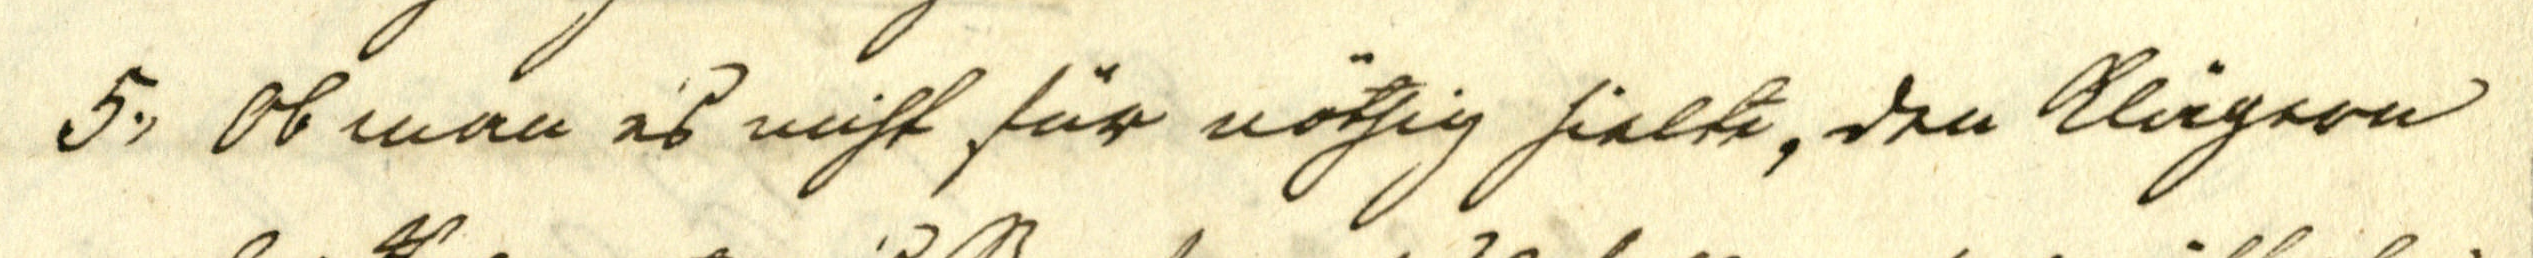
5., Ob man es nicht für nöthig hielte, den Klägern
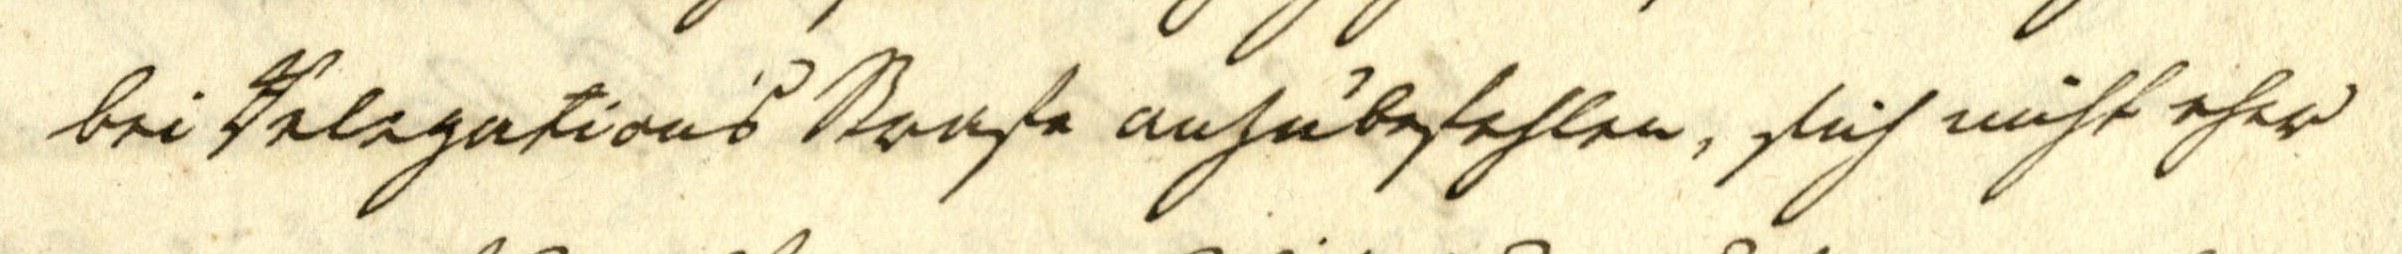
bei Relegations Strafe anzubefehlen, sich nicht eher
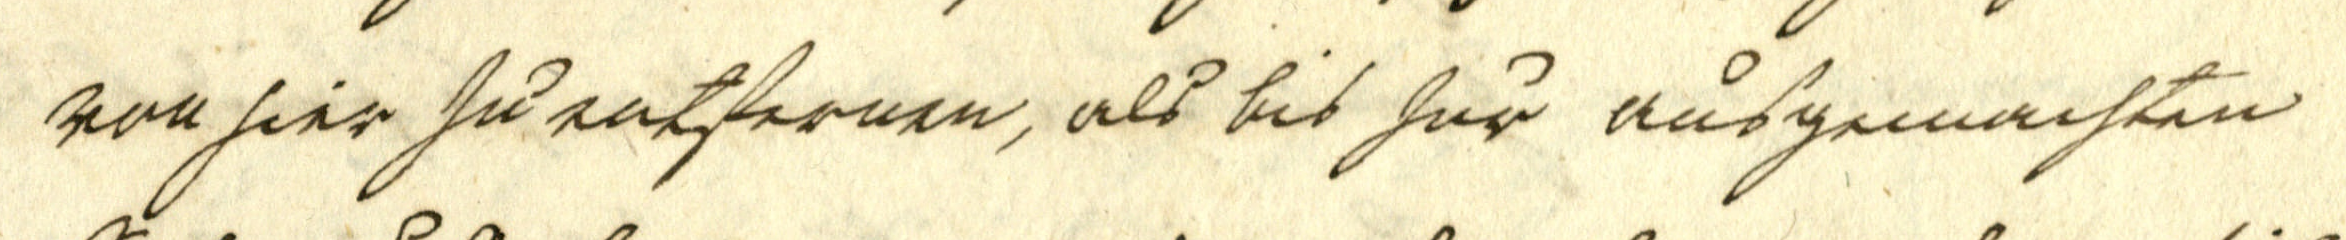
von hier zu entfernen, als bis zur ausgemachten
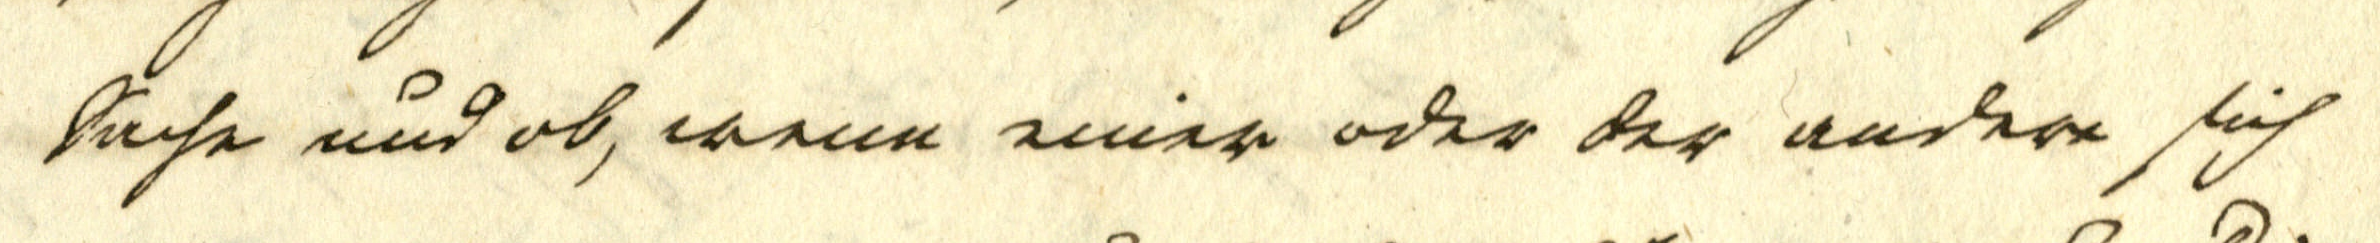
Sache und ob, wenn einer oder der andere sich
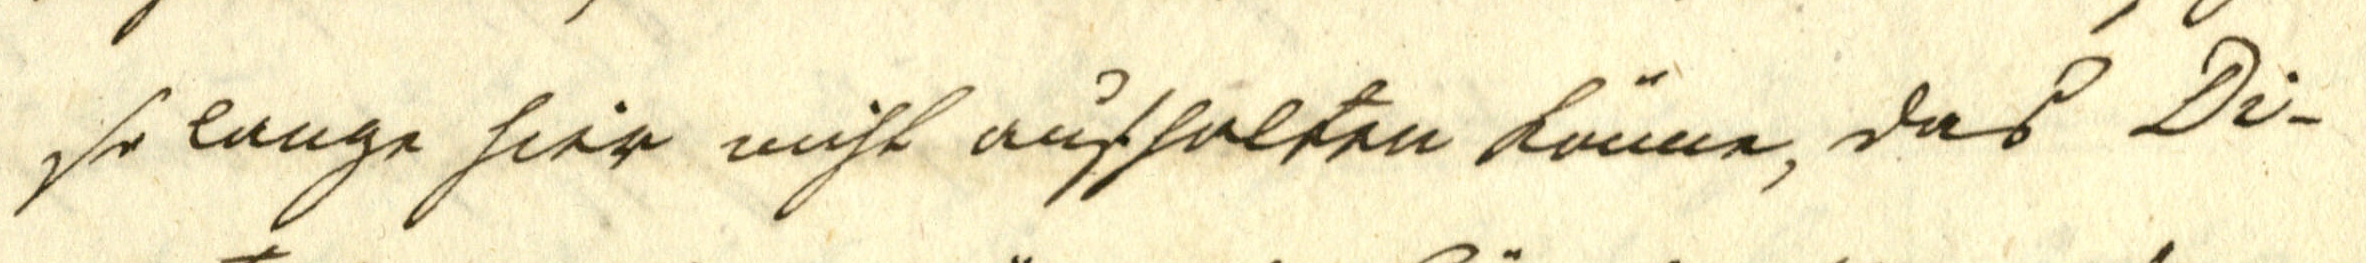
so lange hier nicht aufhalten könne, das Di¬
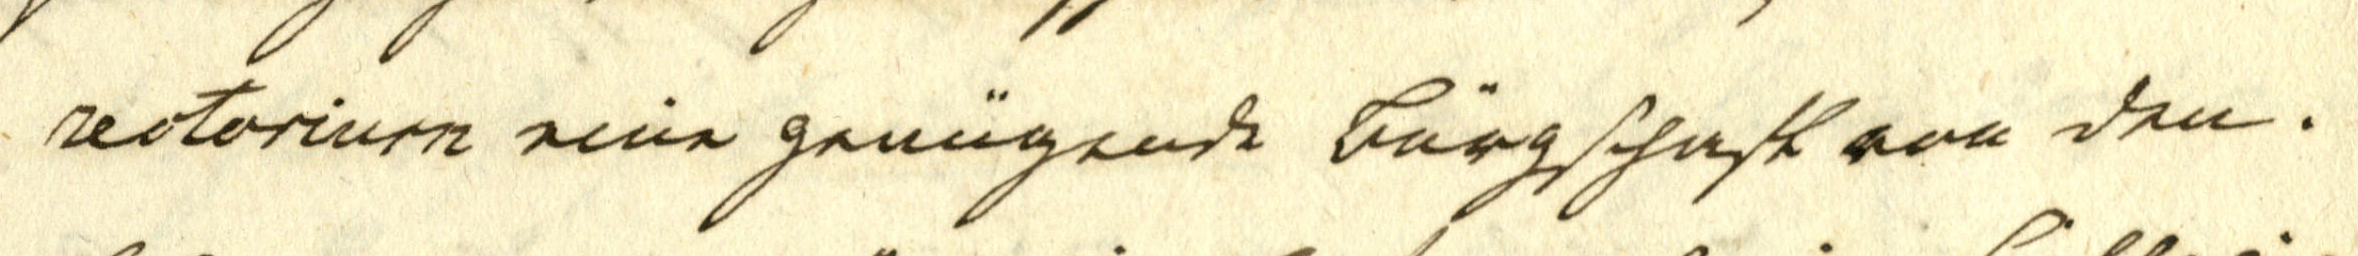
rectorium eine genügende Bürgschaft von den¬
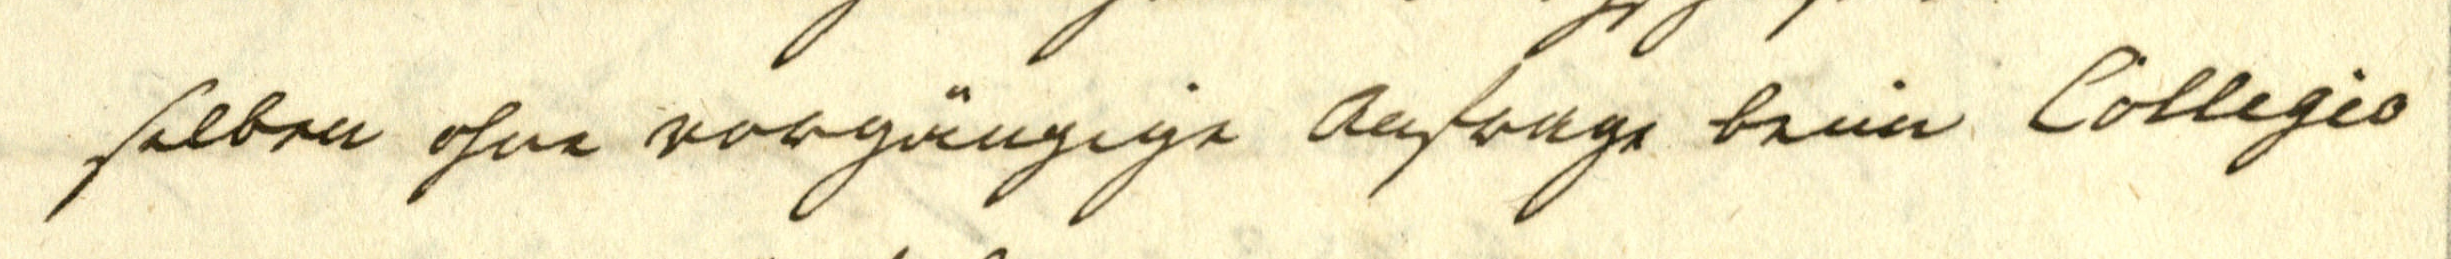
selben ohne vorgängige Anfrage beim Collegio
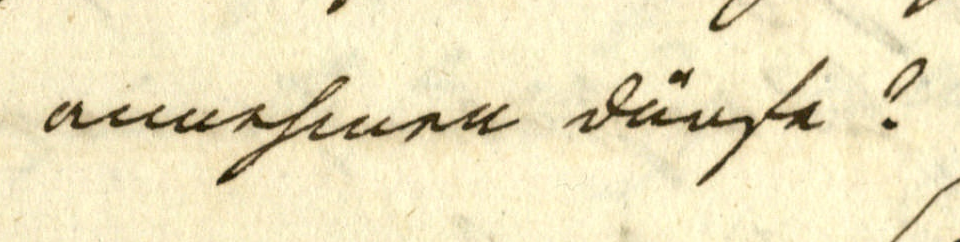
annehmen dürfe?
